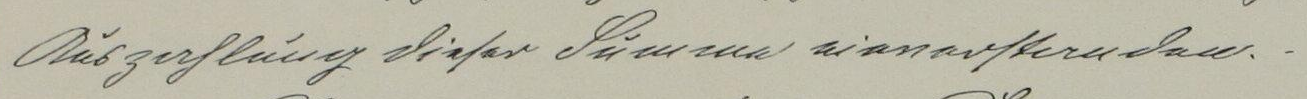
Auszahlung dieser Summe einverstanden.
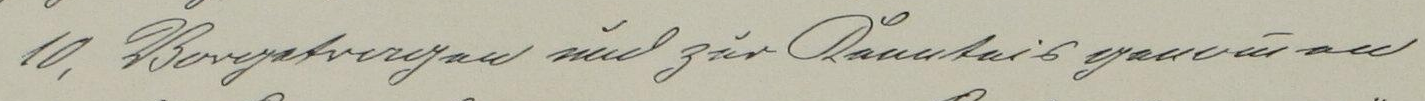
10. Vorgetragen und zur Kenntnis genommen
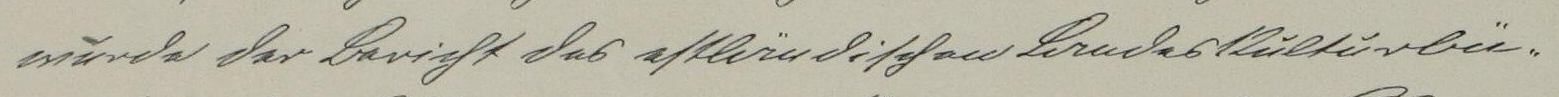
wurde der Bericht des estländischen Landeskulturbü-
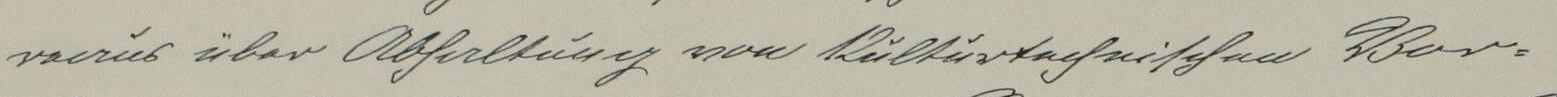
reaus über Abhaltung von kulturtechnischen Vor-
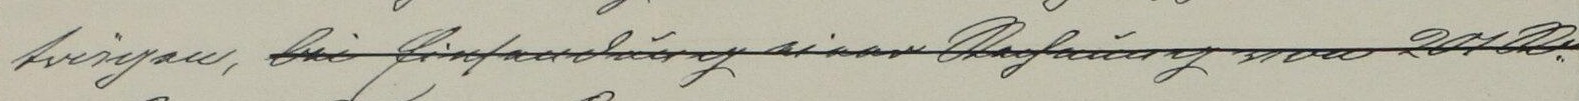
trägen, bei Einsendung einer Rechnung von 201 Ro.
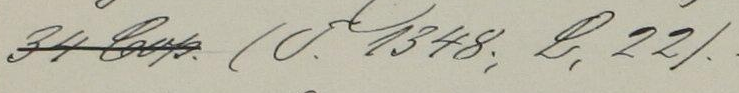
34 Cop. (T.1348; L.22)
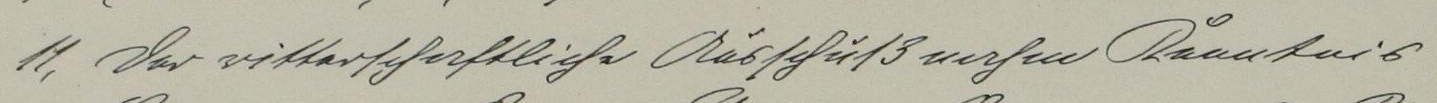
11. Der ritterschaftliche Ausschuß nahm Kenntnis
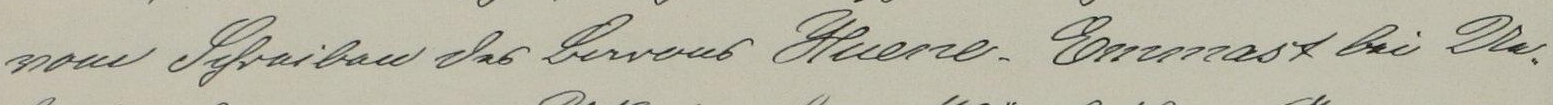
vom Schreiben des Barons Huene-Emmast bei Ue-
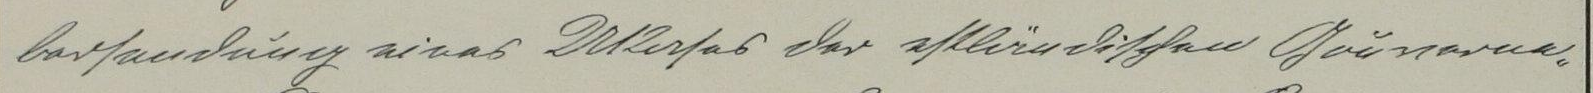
bersendung eines Ukases der estländischen Gouverne-
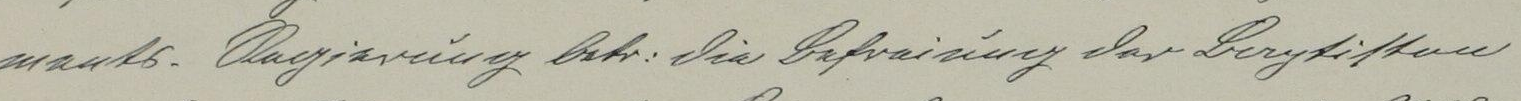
ments-Regierung betr. die Befreiung der Baptisten
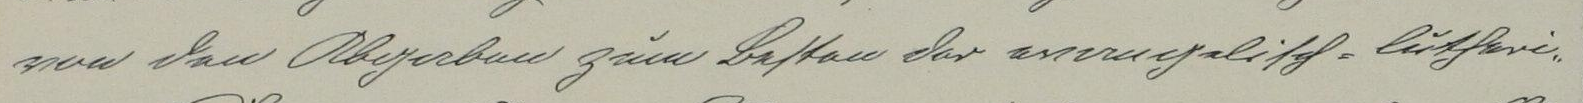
von den Abgaben zum Besten der evangelisch-lutheri-
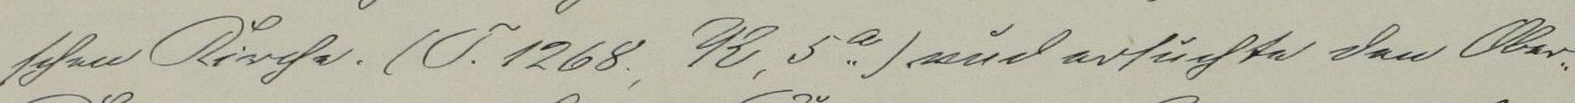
schen Kirche. (T.1268; K.5a) und ersuchte den Ober-
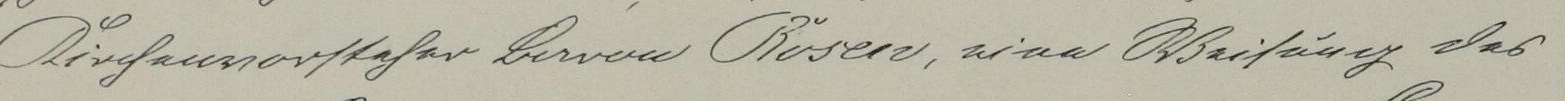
Kirchenvorsteher Baron Rosen, eine Weisung des
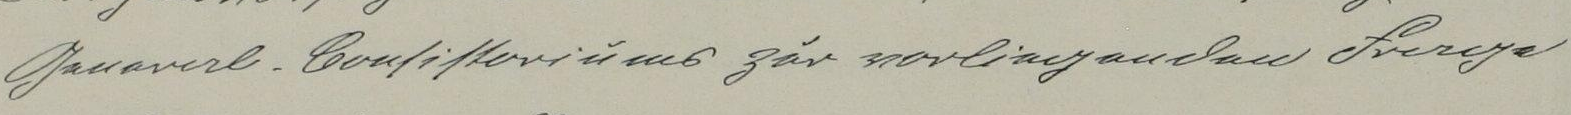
General-Consistoriums zur vorliegenden Frage
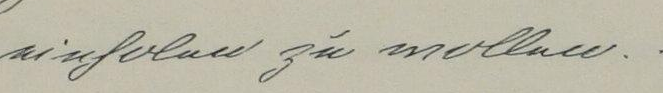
einholen zu wollen.
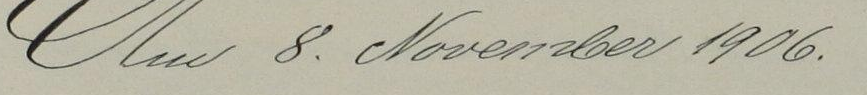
Am 8. November 1906.
